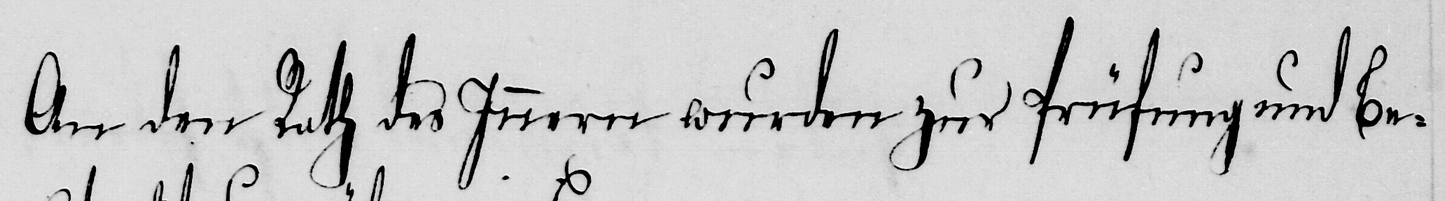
An den Rath des Innern wurden zur Prüfung und Be¬
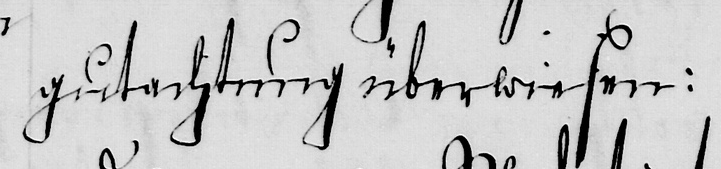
gutachtung überwiesen:
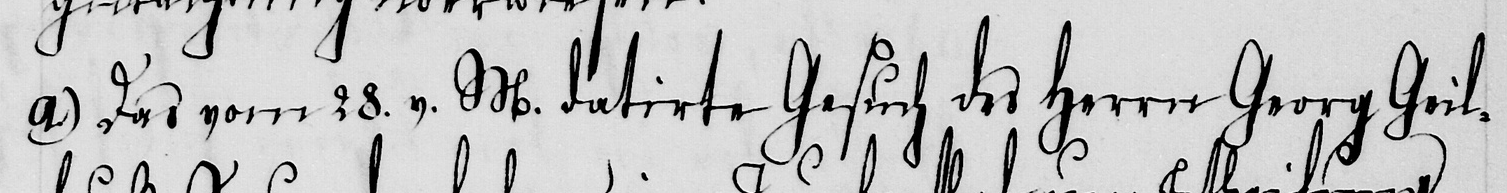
a.) Das vom 28. v. M. datirte Gesuch des Herrn Georg Geil¬
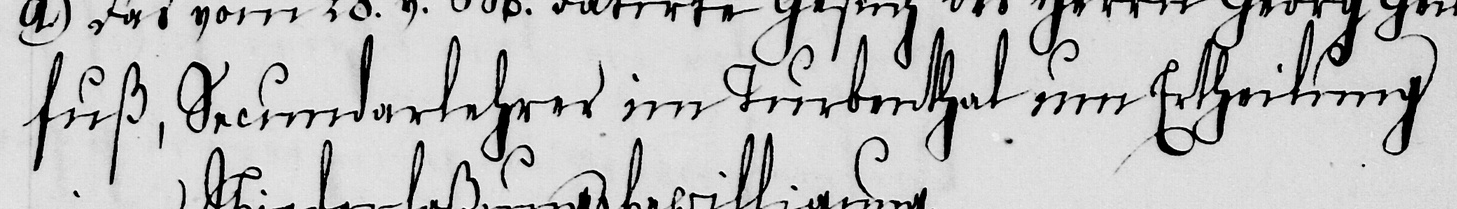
fuß, Secundarlehrer im Turbenthal um Ertheilung
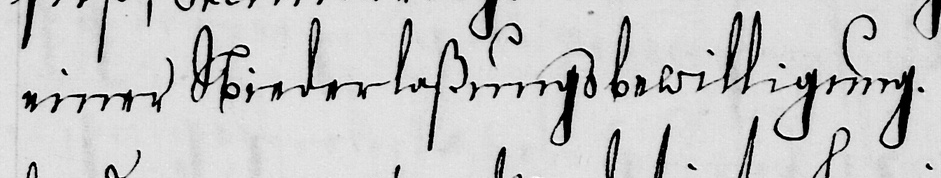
einer Niederlaßungsbewilligung.
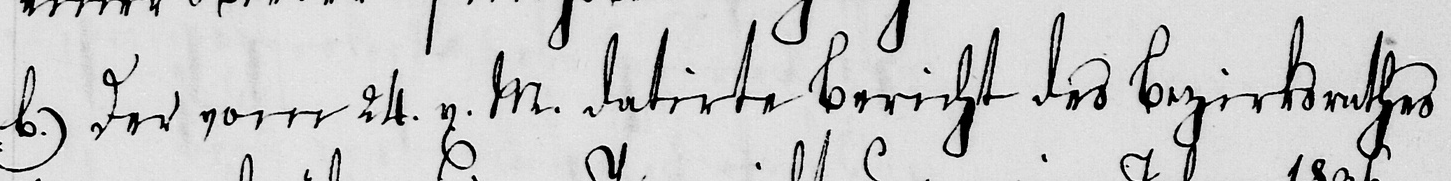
b.) Der vom 24. v. M. datirte Bericht des Bezirksrathes
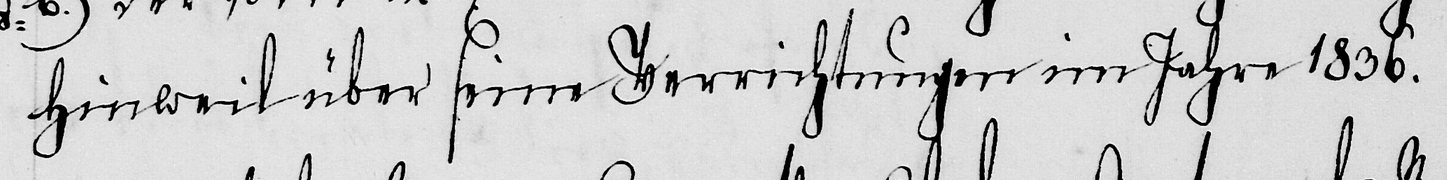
Hinweil über seine Verrichtungen im Jahre 1836.
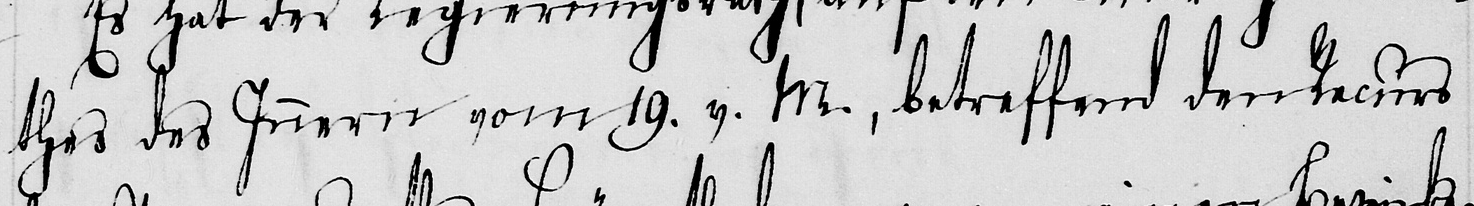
thes des Innern vom 19. v. M., betreffend den Recurs
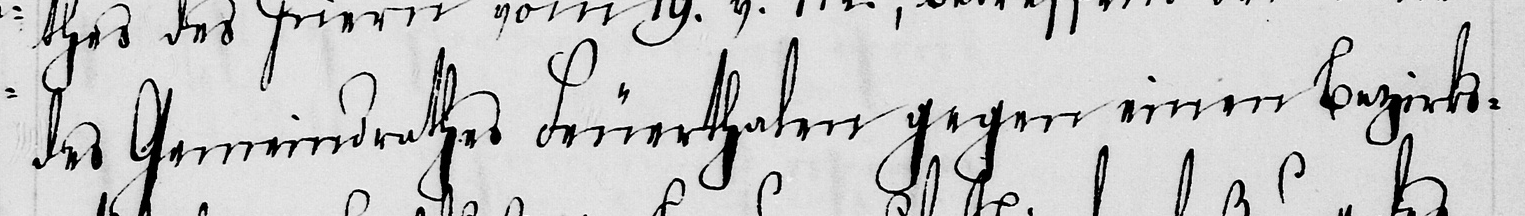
des Gemeindrathes Feuerthalen gegen einen Bezirks¬
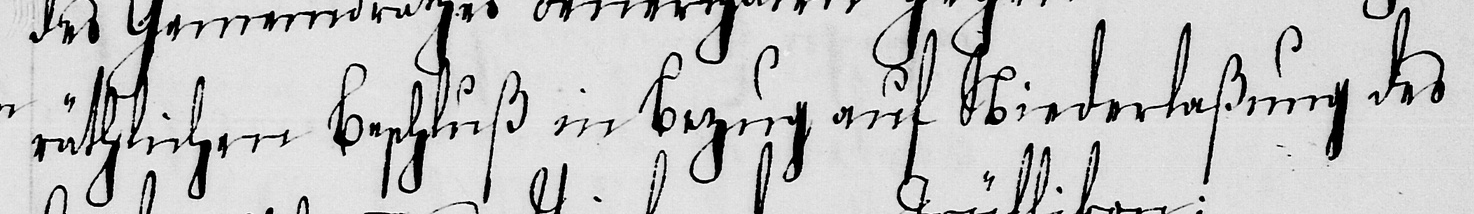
räthlichen Beschluß in Bezug auf Niederlaßung des
